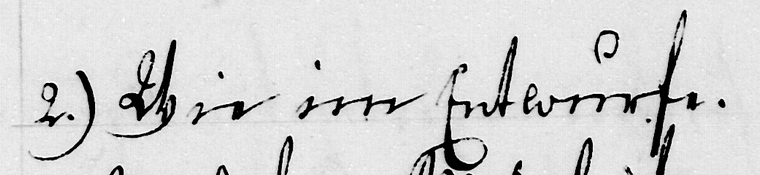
2.) Wie im Entwurfe.
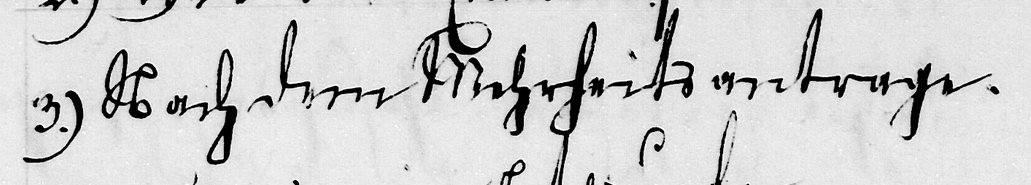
3.) Nach dem Mehrheitsantrage.
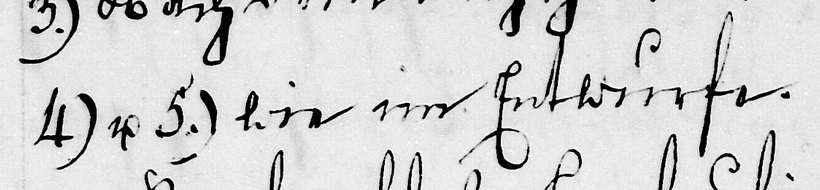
4) u. 5.) wie im Entwurfe.
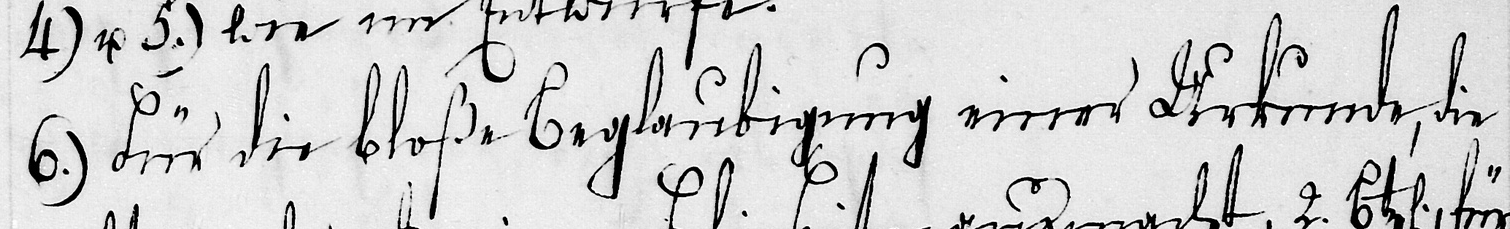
6.) Für die bloße Beglaubigung einer Urkunde, die
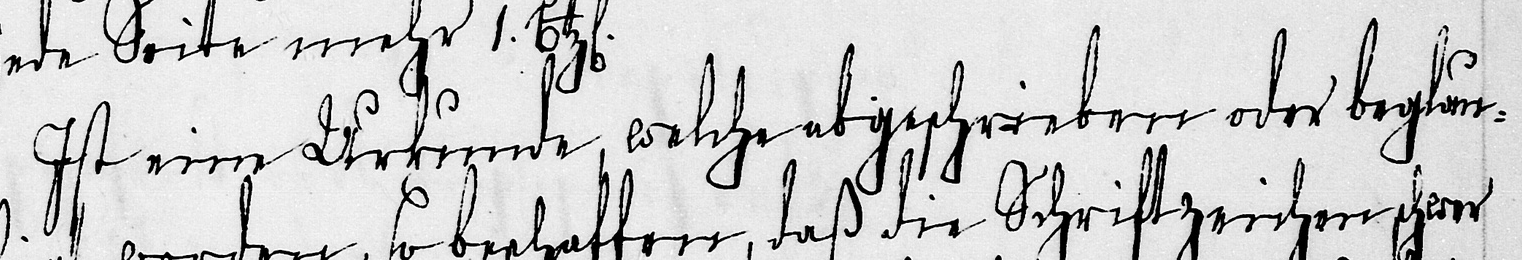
Ist eine Urkunde, welche abgeschrieben oder beglau¬
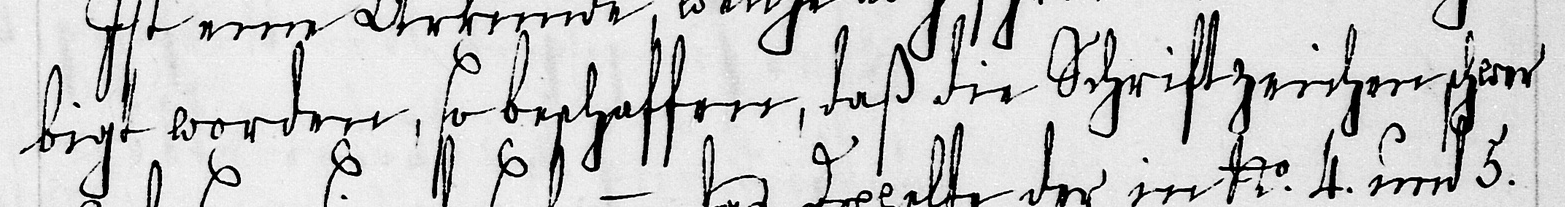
bigt worden, so beschaffen, daß die Schriftzeichen schwer
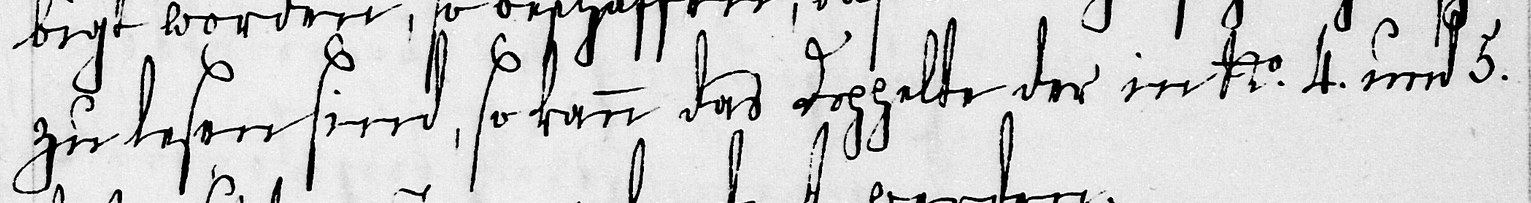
zu lesen sind, so kann das Doppelte der in No. 4. und 5.
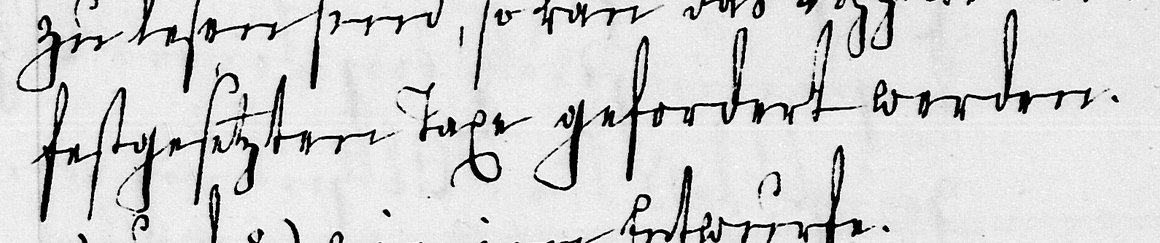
festgesetzten Taxe gefordert werden.
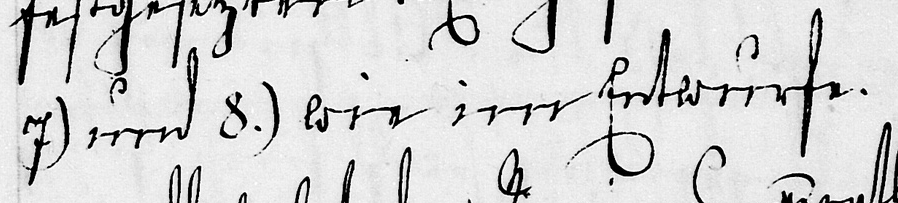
7) und 8.) wie im Entwurfe.
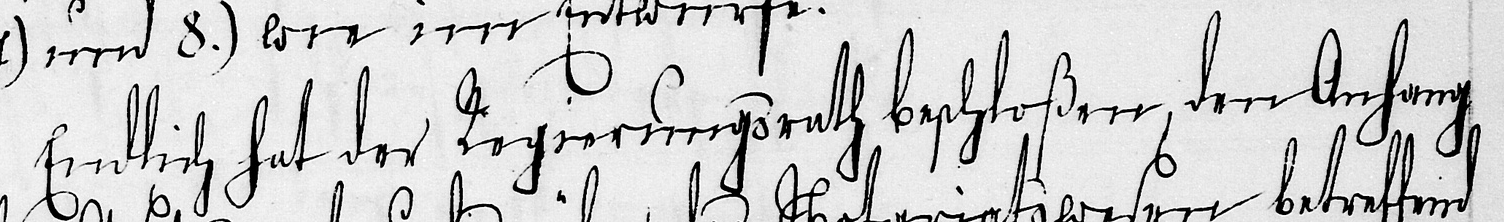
Endlich hat der Regierungsrath beschloßen, den Anhang
